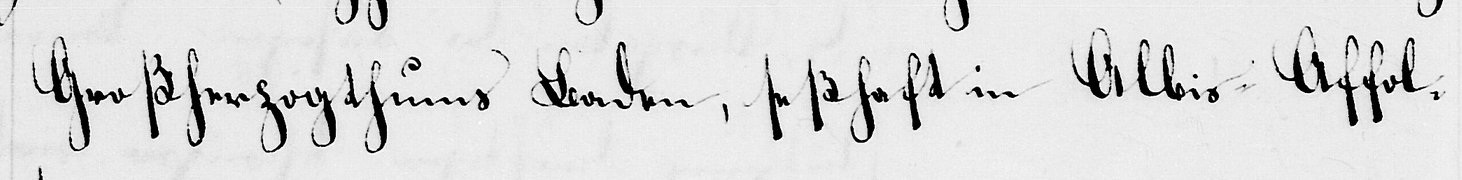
Großherzogthums Baden, seßhaft in Albis-Affol¬
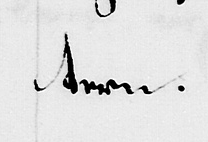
tern.
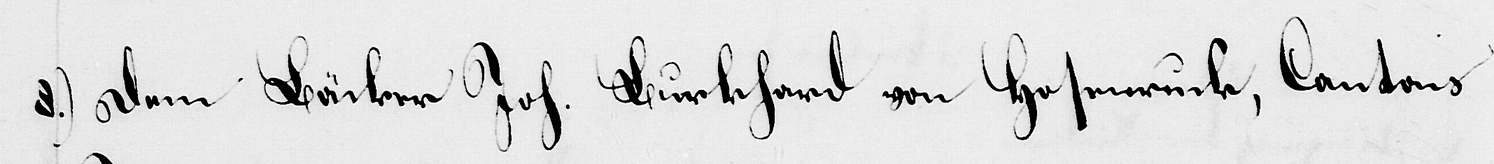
8.) Dem Bäcker Joh. Burkhard von Hosenruck, Cantons
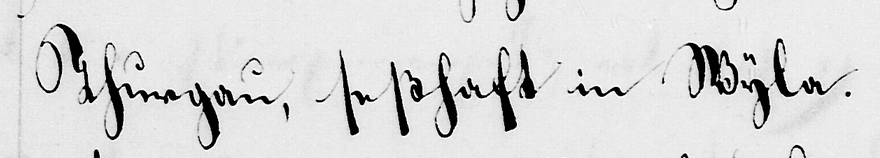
Thurgau, seßhaft in Wyla.
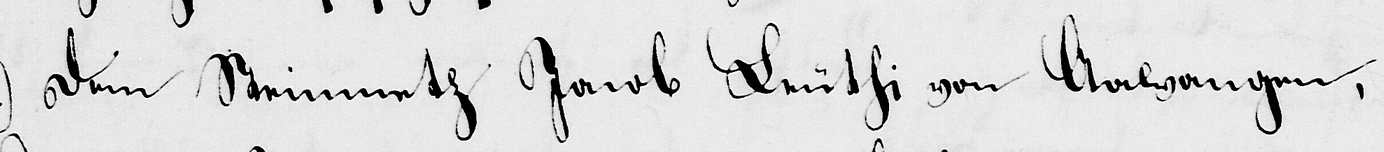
Dem Steinmetz Jacob Leuthi von Aawangen,
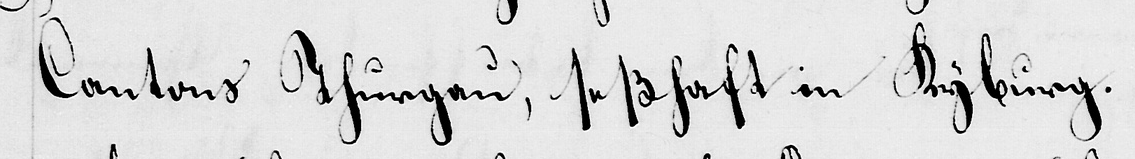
Cantons Thurgau, seßhaft in Kyburg.
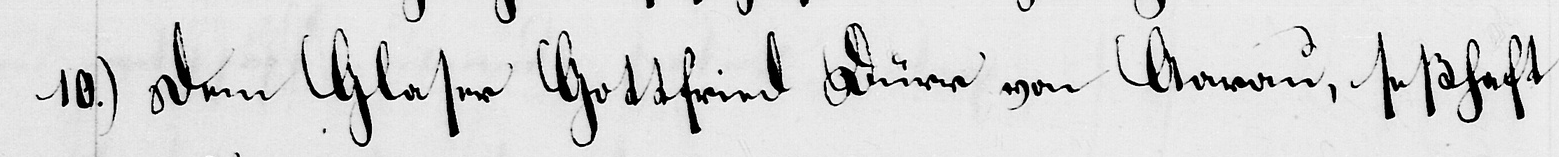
10.) Dem Glaser Gottfried Dürr von Aarau, seßhaft
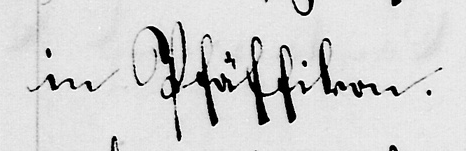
in Pfäffikon.
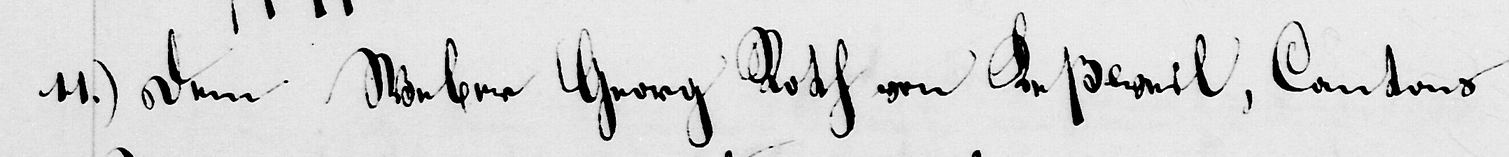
11.) Dem Weber Georg Roth von Keßweil, Cantons
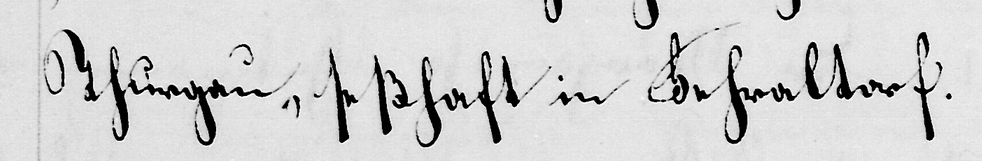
Thurgau, seßhaft in Fehraltorf.
